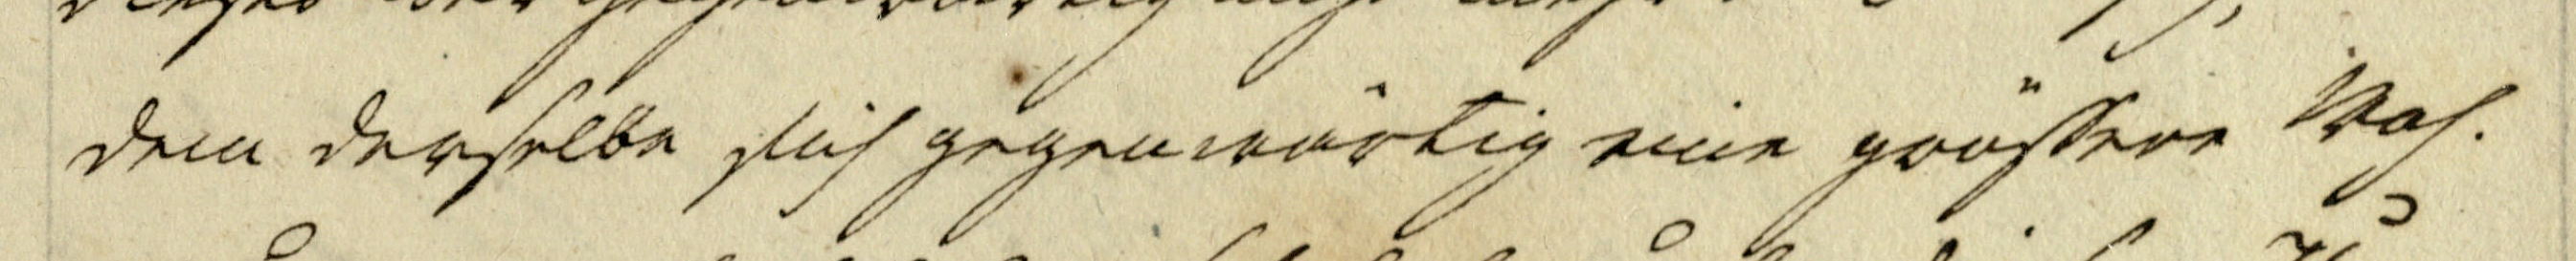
dem derselbe sich gegenwärtig eine grössere Woh¬
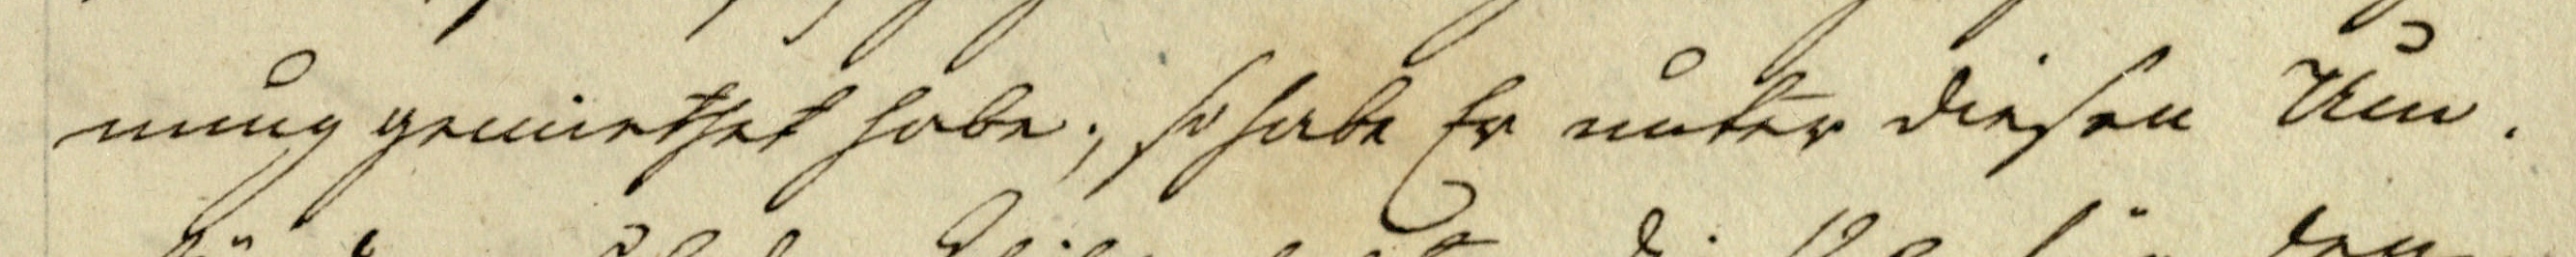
nung gemiethet habe; so habe Er unter diesen Um¬
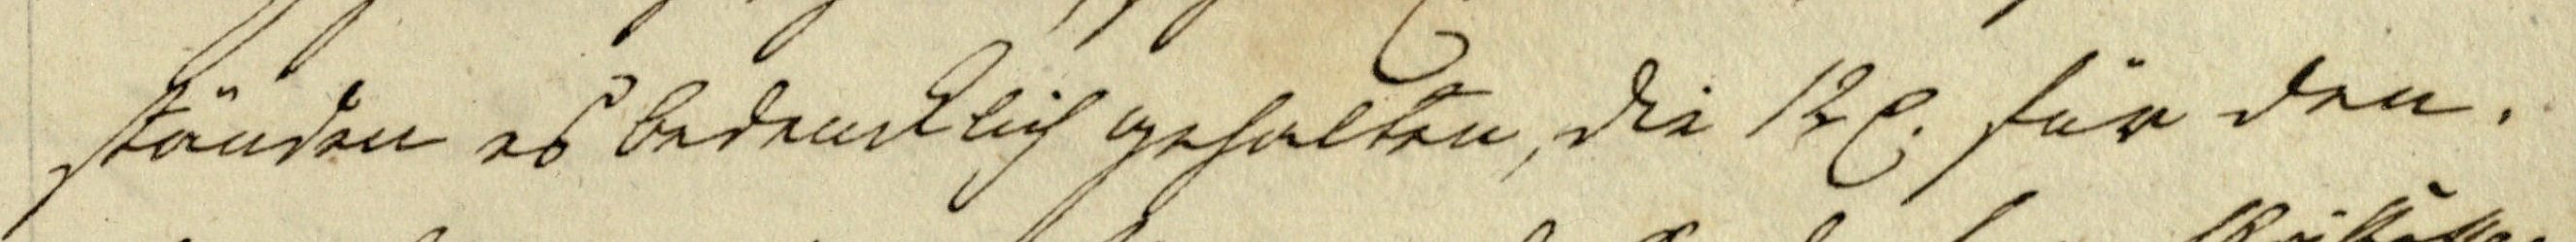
ständen es bedencklich gehalten, die 12 l, für den¬
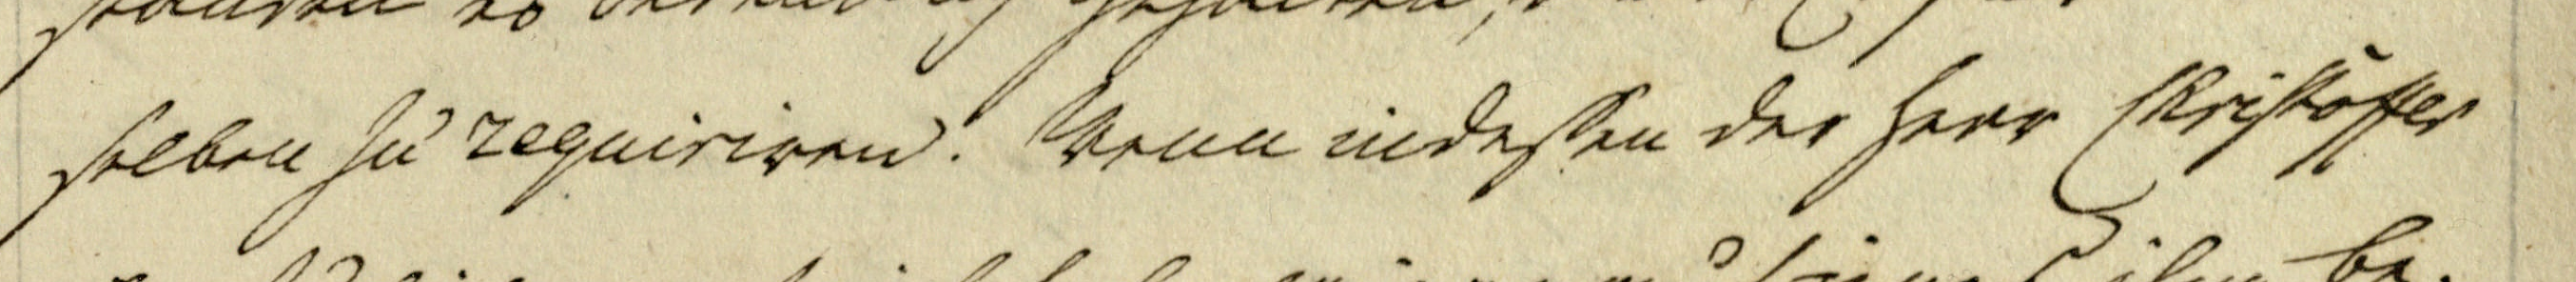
selben zu requiriren. Wenn indessen der Herr Cristoffer
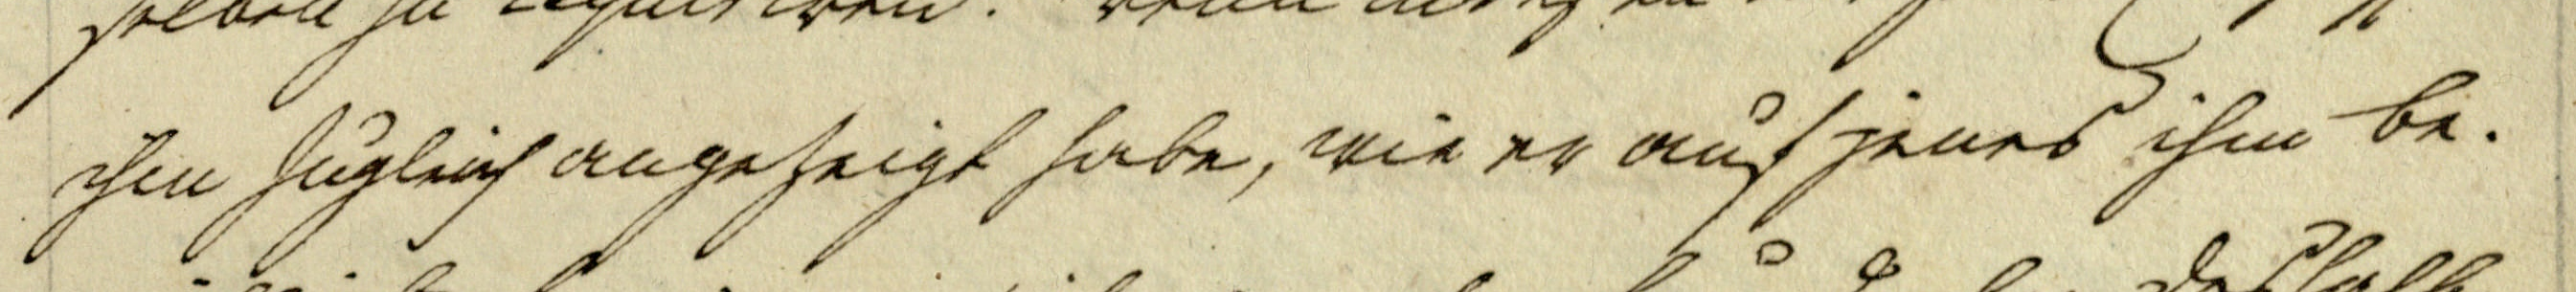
ihm zugleich angezeigt habe, wie er auf jenes ihm be¬
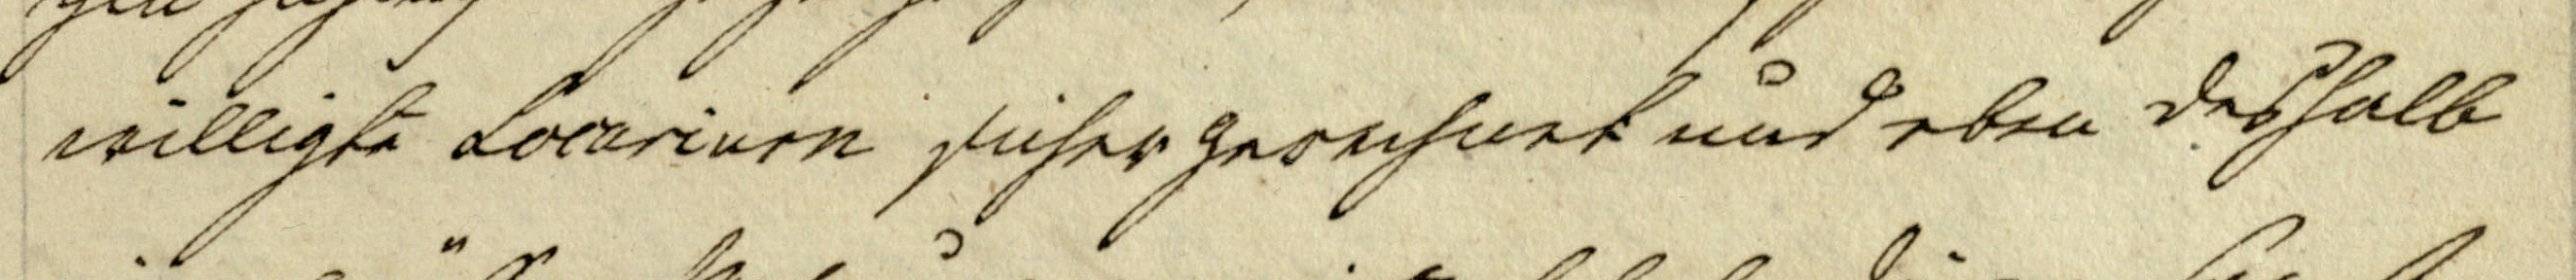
willigte Locarium sicher gerechnet und eben deshalb
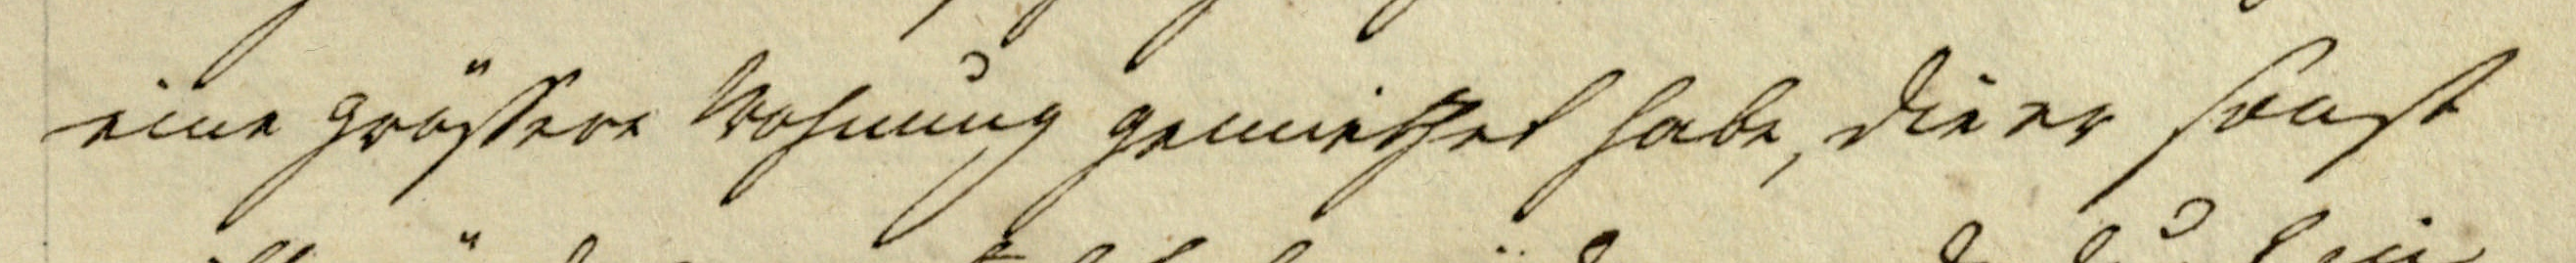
eine grössere Wohnung gemiethet habe, die er sonst
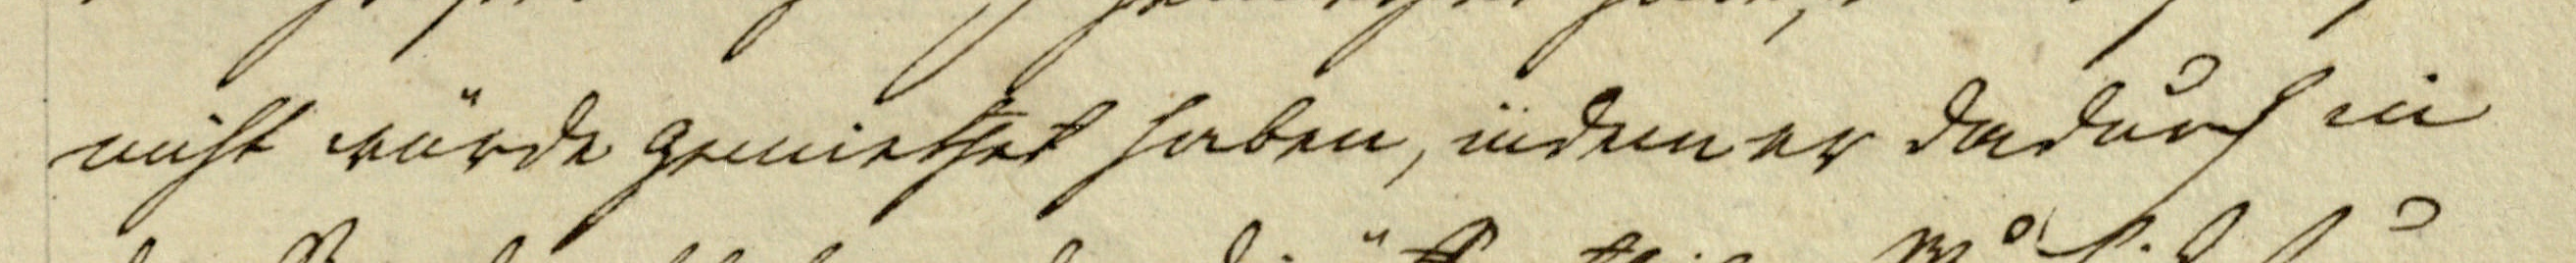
nicht würde gemiethet haben, indem er dadurch in
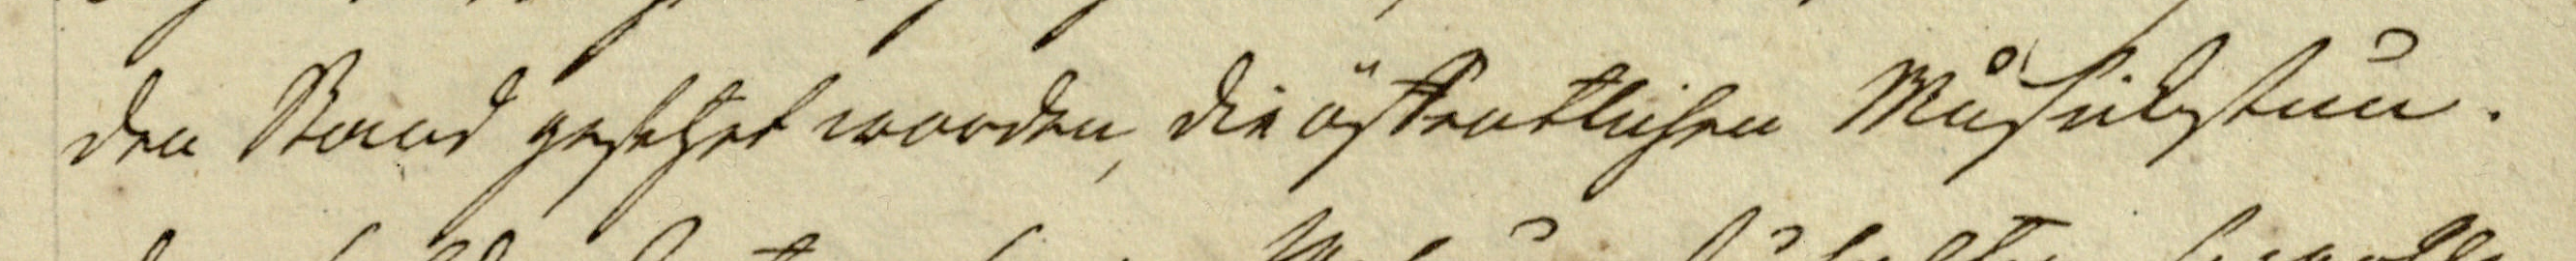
den Stand gesetzet worden, die öffentlichen Musickstun¬
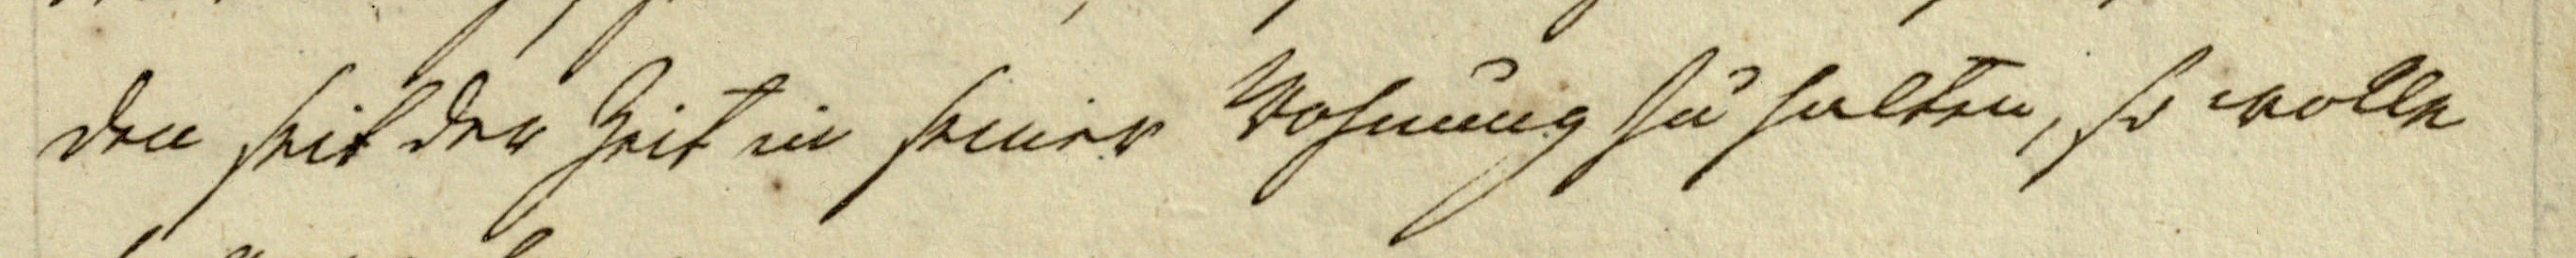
den seit der Zeit in seiner Wohnung zu halten, so wolle
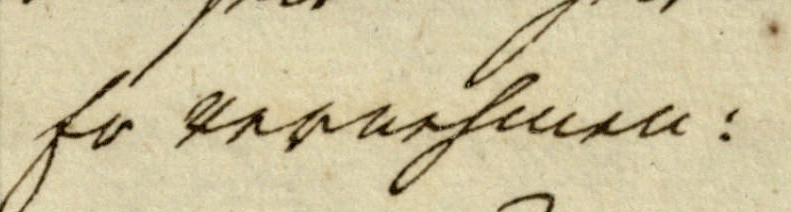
Er vernehmen:
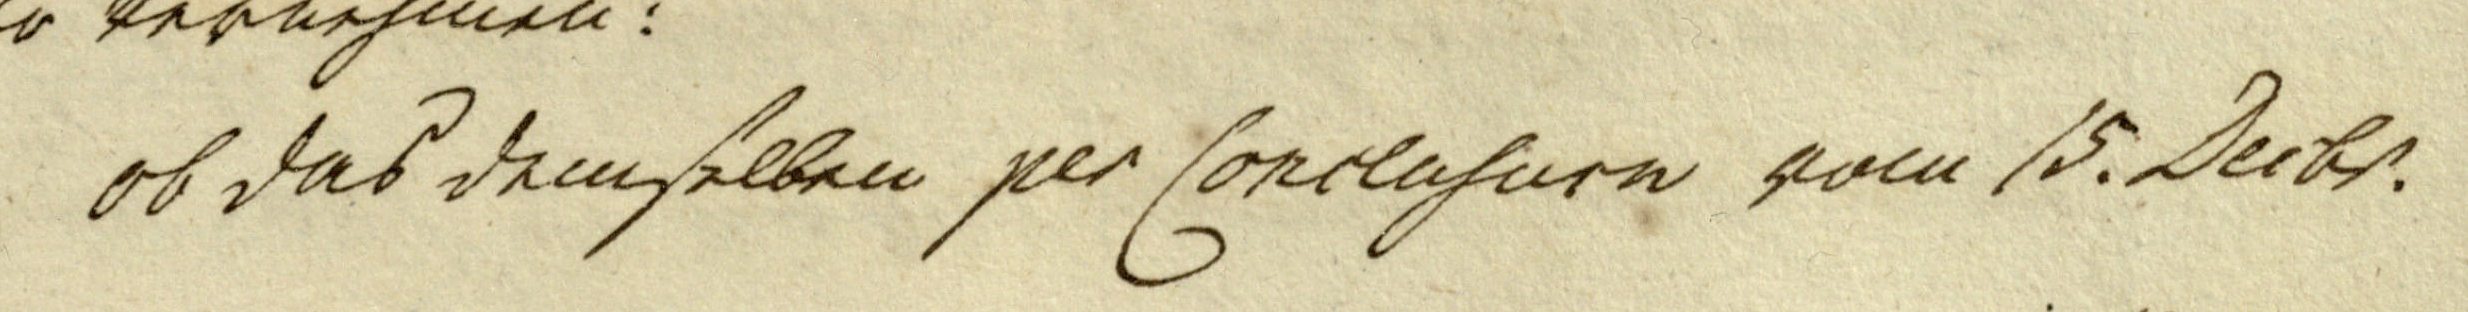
ob das demselben per Conclusum vom 15. Decbr.
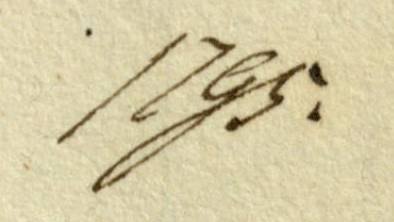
1795.
